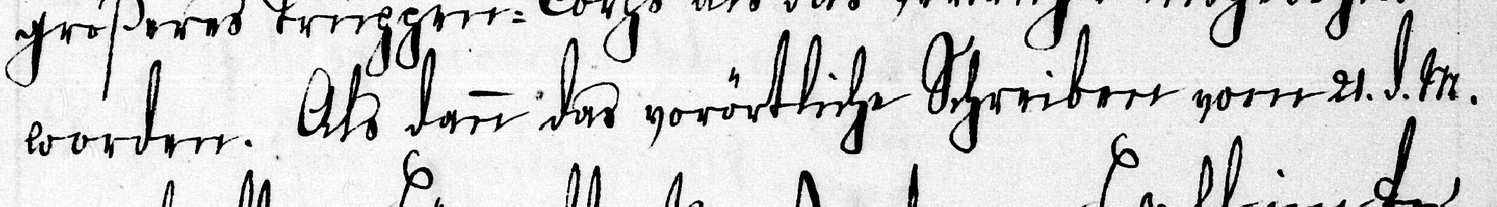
worden. Als dann das vorörtliche Schreiben vom 21. d. M.
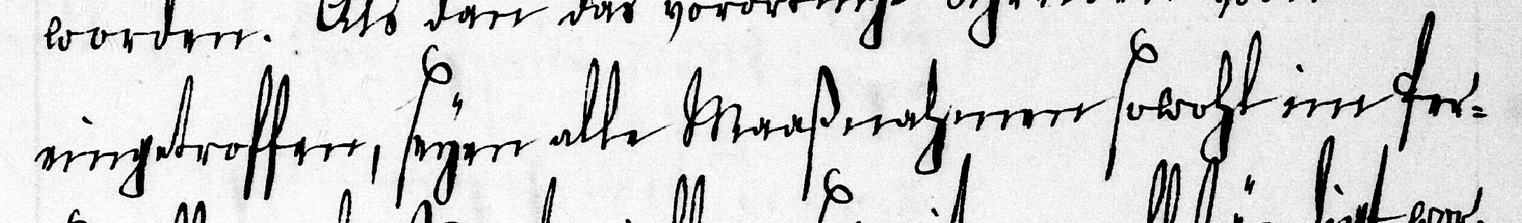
eingetroffen, seyen alle Maaßnahmen sowohl im Per¬
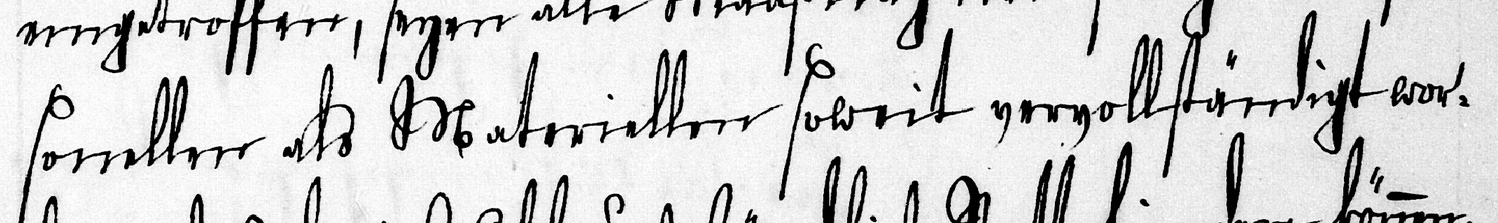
sonellen als Materiellen soweit vervollständigt wor¬
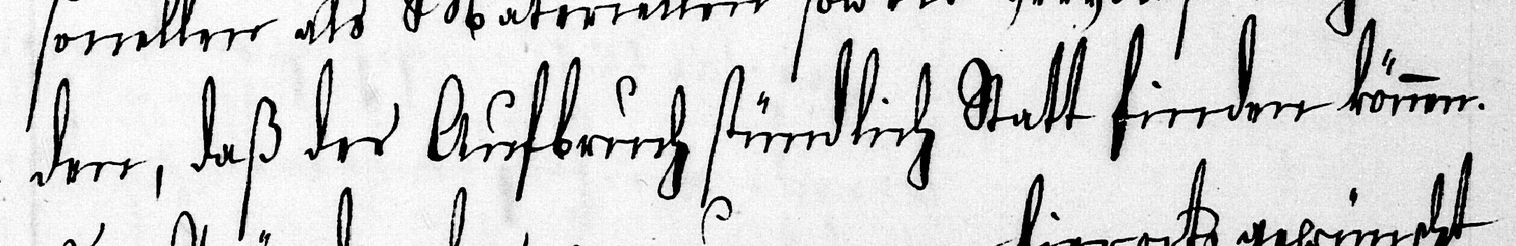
den, daß der Aufbruch stündlich Statt finden könne.
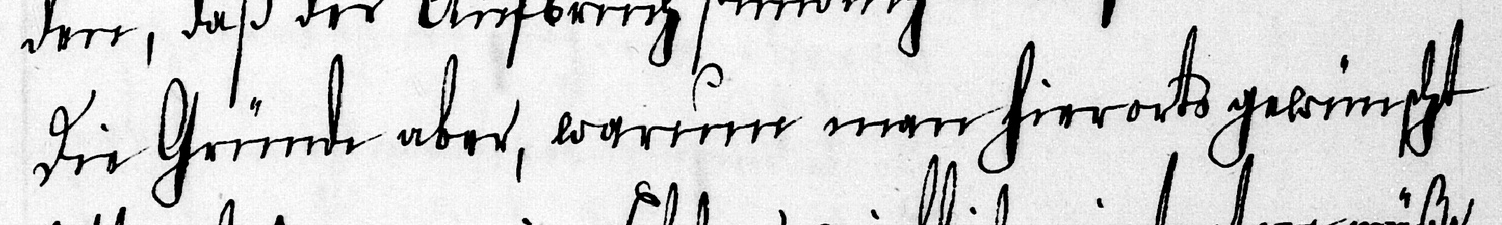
Die Gründe aber, warum man hierorts gewünscht
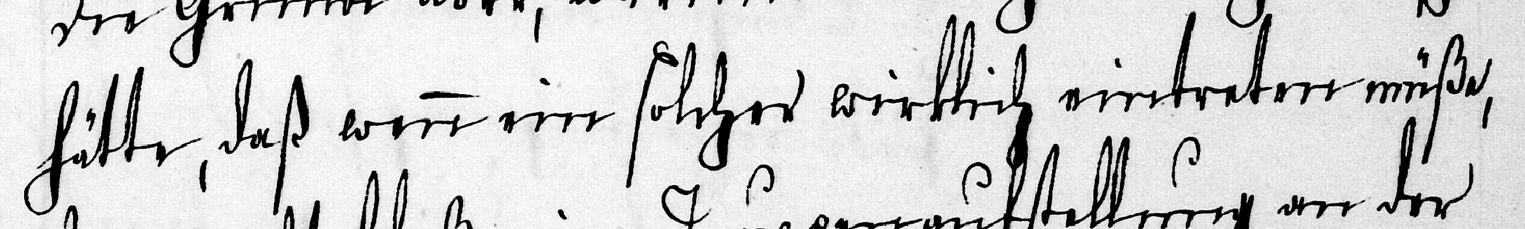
hätte, daß wenn ein solcher wirklich eintreten müße,
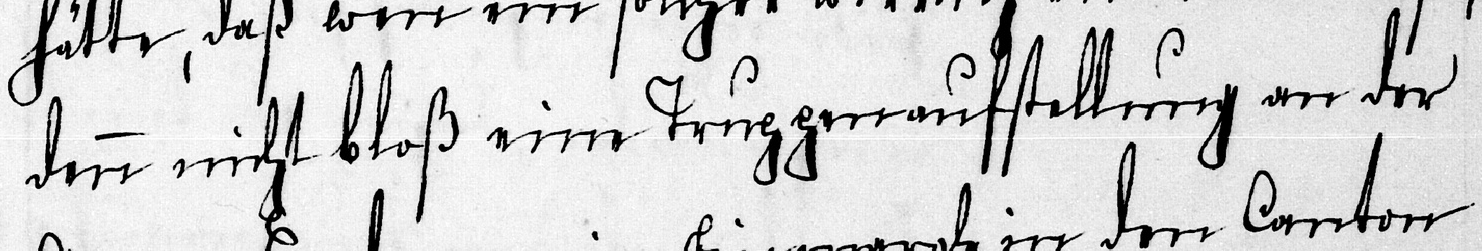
denn nicht bloß eine Truppenaufstellung an der
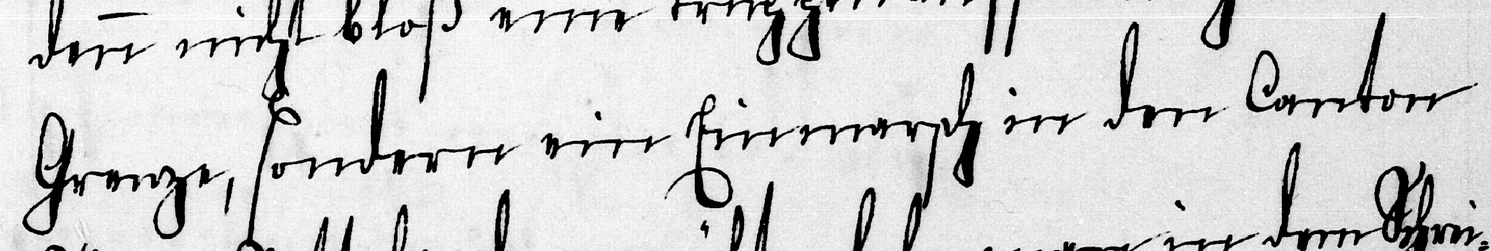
Grenze, sondern ein Einmarsch in den Canton
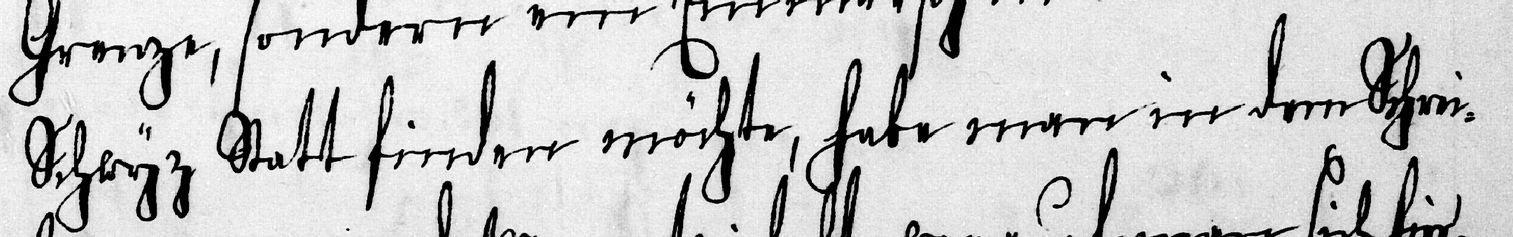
Schwyz Statt finden möchte, habe man in dem Schrei¬
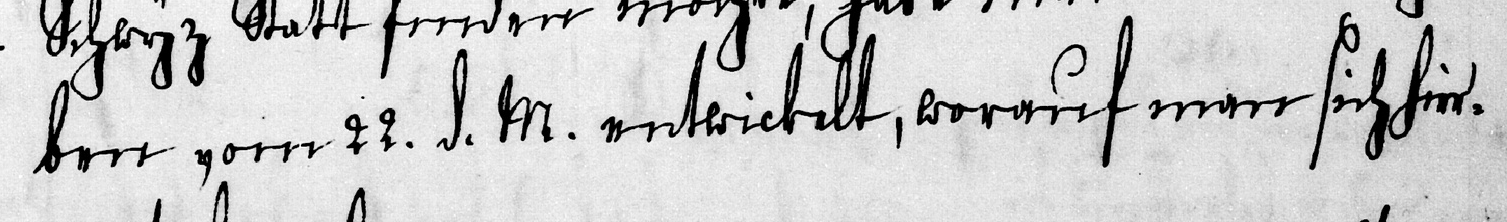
ben vom 22. d. M. entwickelt, worauf man sich hie¬
